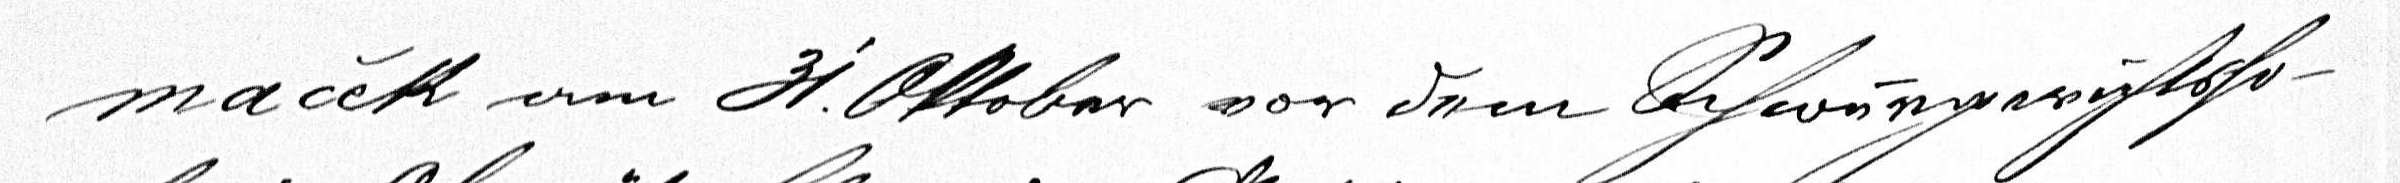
maček am 31. Oktober vor dem Schwurgerichtsho¬
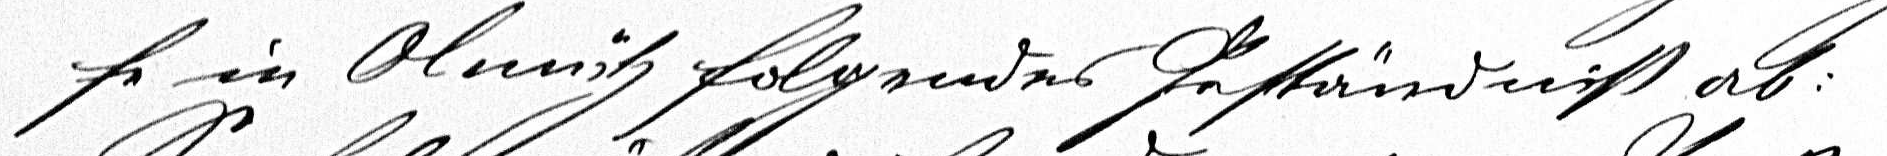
fe in Olmütz folgendes Geständnis ab:
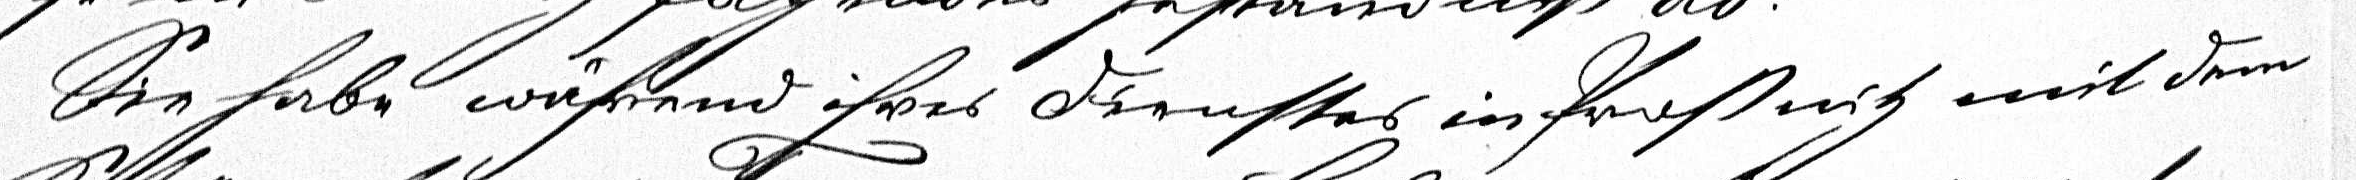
Sie habe während ihres Dienstes in Proßnitz mit dem
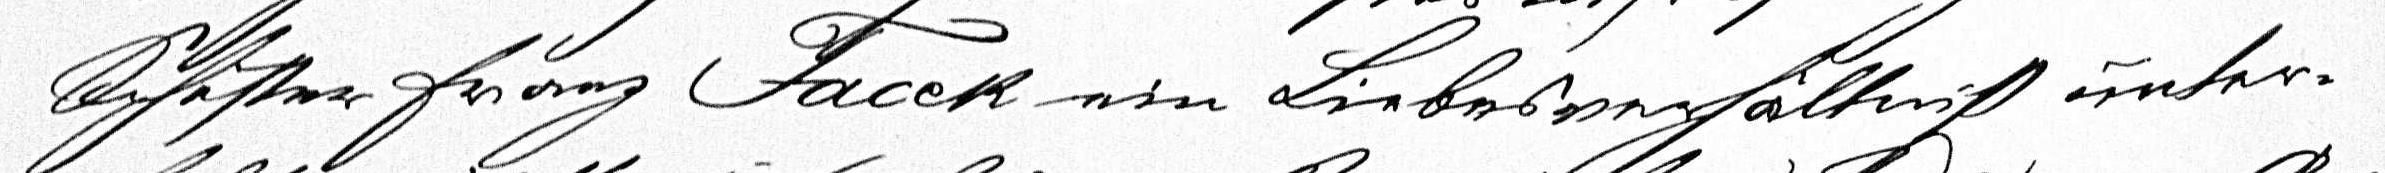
Schuster Franz Facek ein Liebesverhältniß unter¬
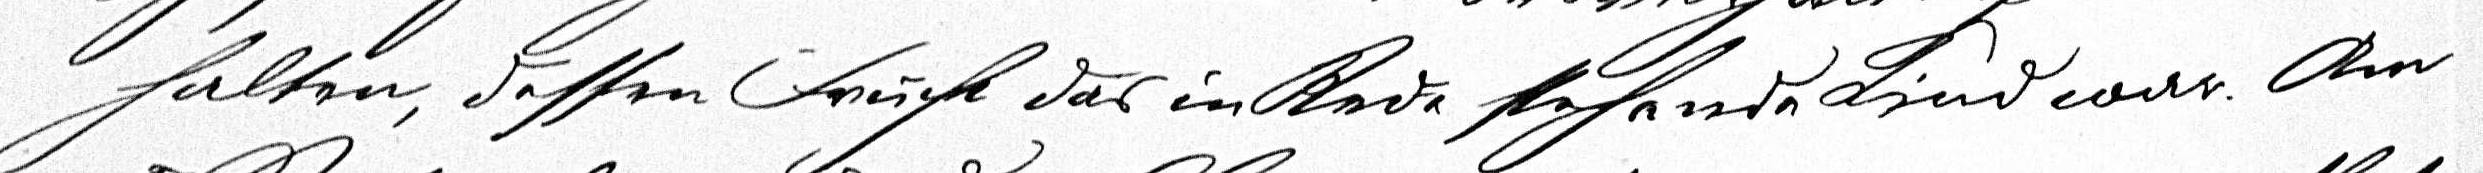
halten, dessen Frucht das in Rede stehende Kind war. Am
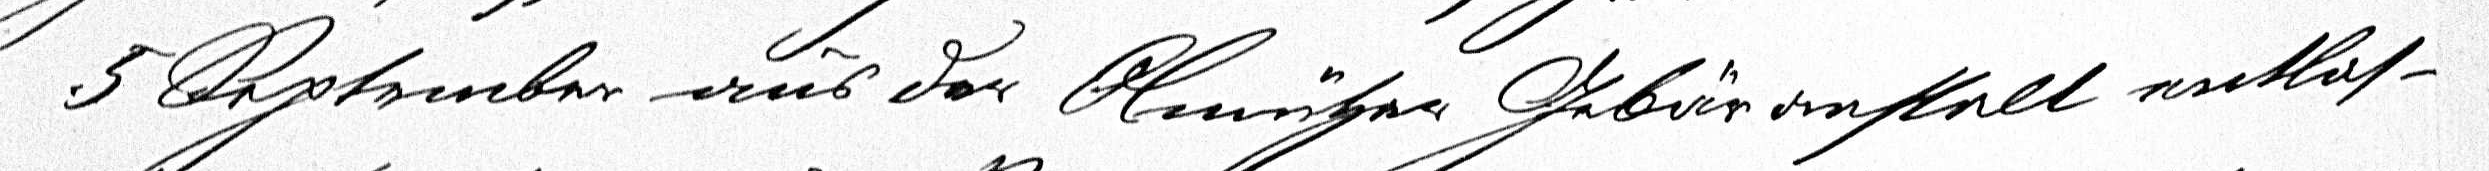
5. September aus der Olmüter Gebäranstalt entlas¬
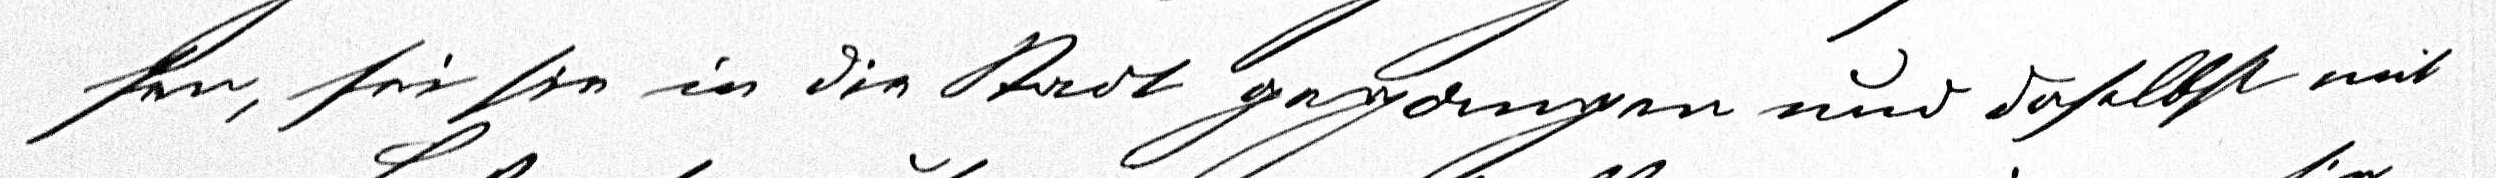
sen, sei sie in die Stadt gegangen und daselbst mit
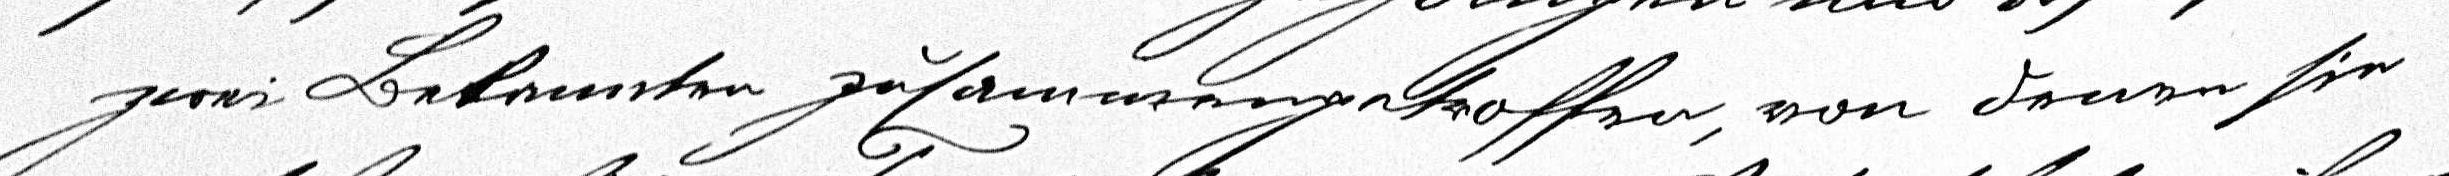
zwei Bekannten zusammengetroffen, von denen sie
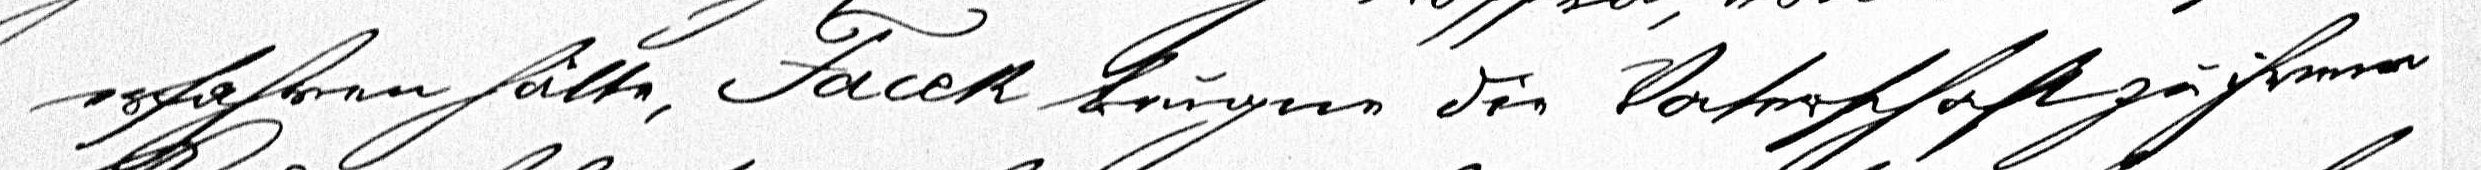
erfahren hatte, Facek leugne die Vaterschaft zu ihrem
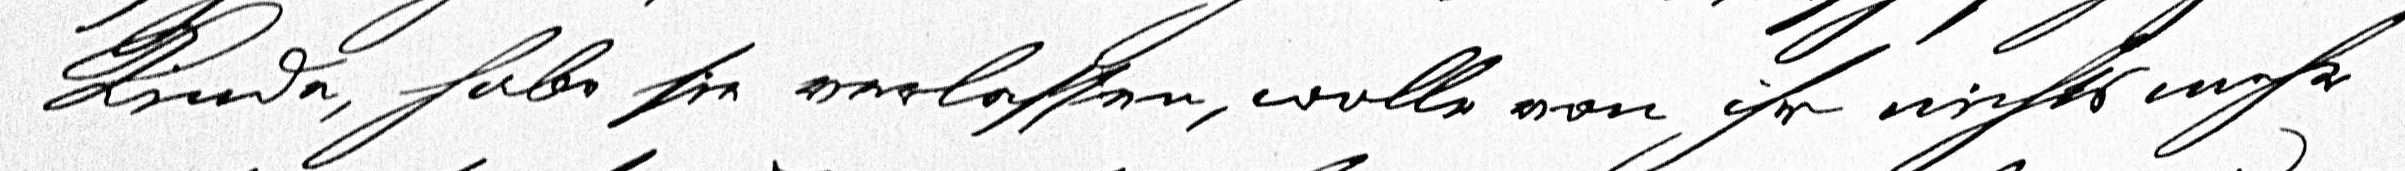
Kinde, habe sie verlassen, wolle von ihr nichts mehr
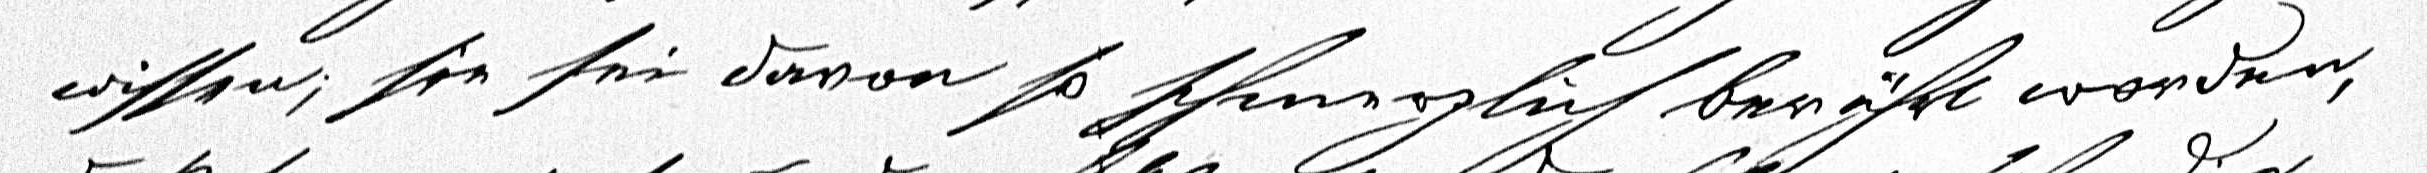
wissen; sie sei davon so schmerzlich berührt worden,
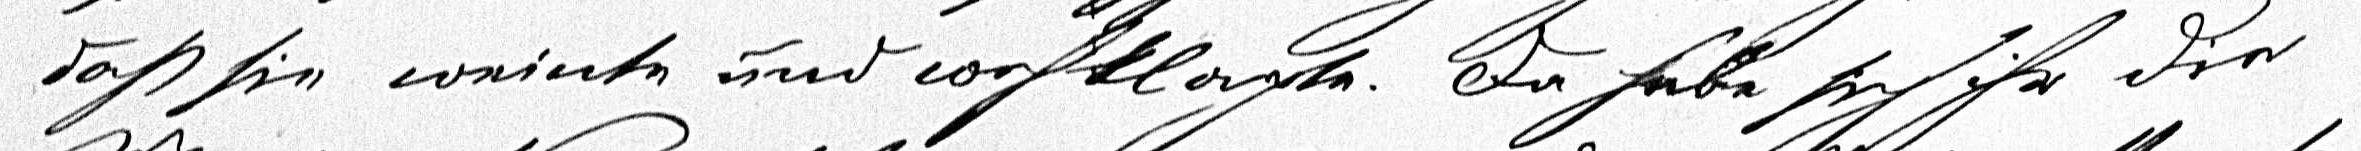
daß sie weinte und
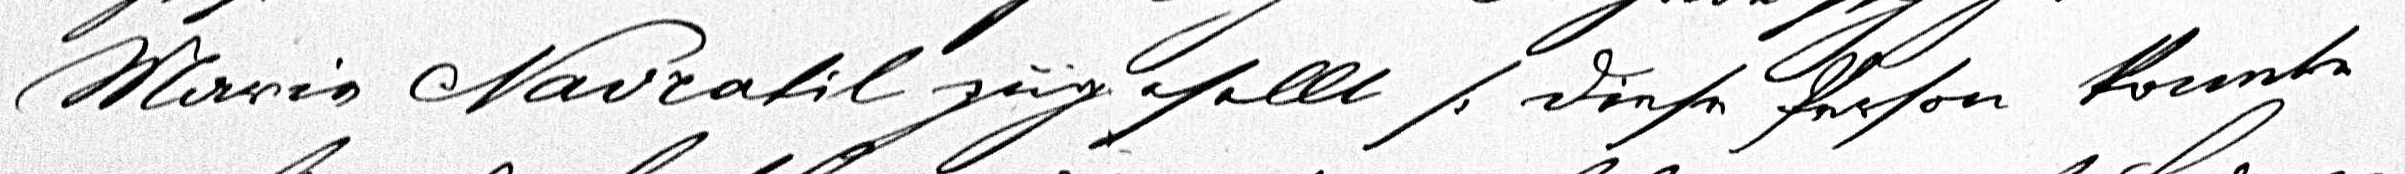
Maria Navzatil zug sellt /: Diese Person Kounte
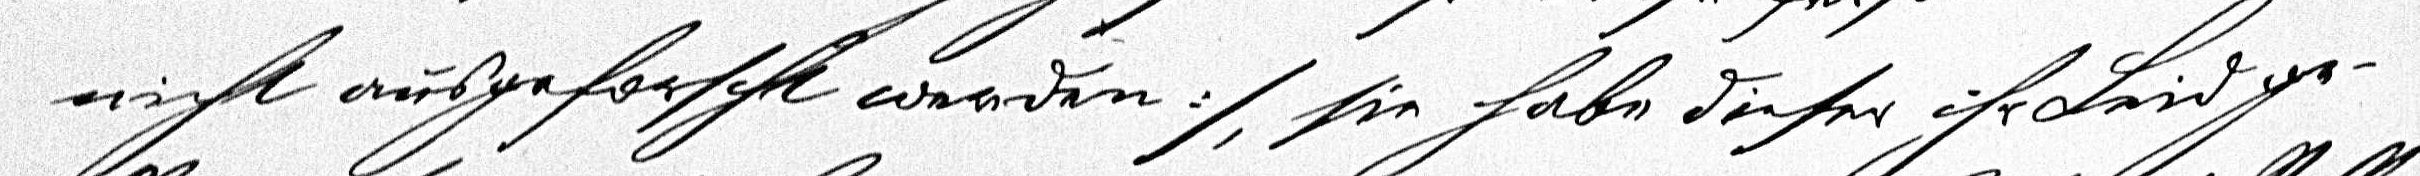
nicht ausgeforsch werden:/, sie Habe dieser ihr Leid ge¬
